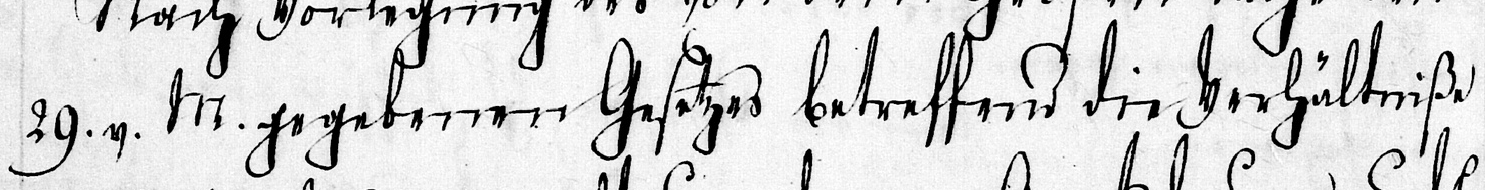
29. v. M. gegebenen Gesetzes betreffend die Verhältniße
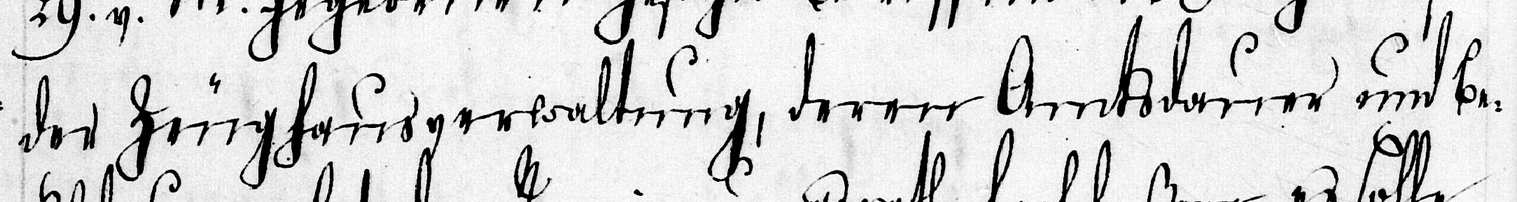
der Zeughausverwaltung, deren Amtsdauer und Be¬
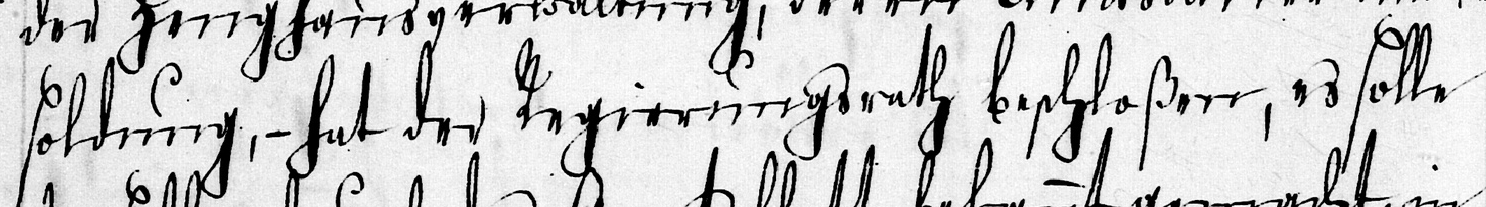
soldung, – hat der Regierungsrath beschloßen, es solle
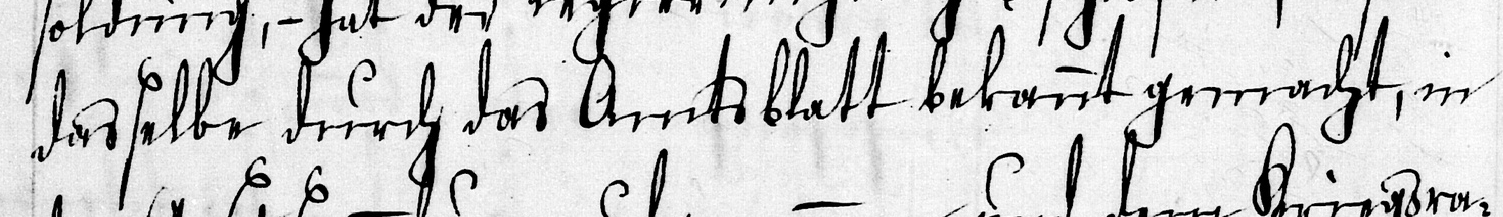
dasselbe durch das Amtsblatt bekannt gemacht, in
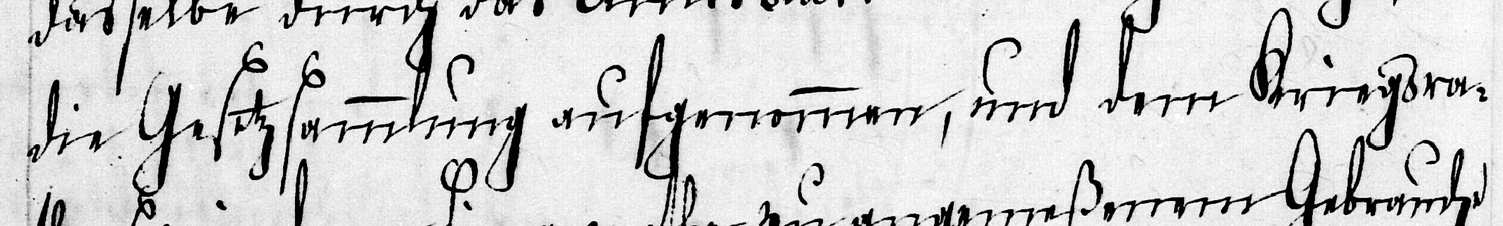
die Gesetzsammlung aufgenommen, und dem Kriegsra¬
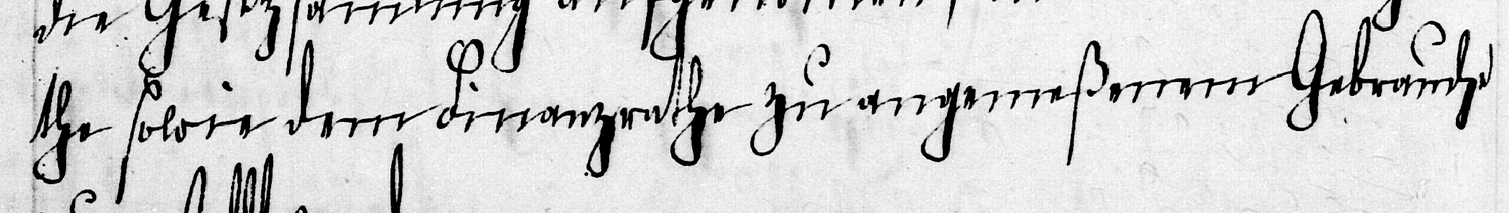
the sowie dem Finanzrathe zu angemeßenem Gebrauche
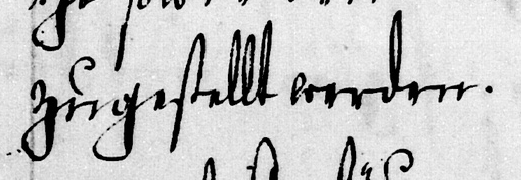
zugestellt werden.
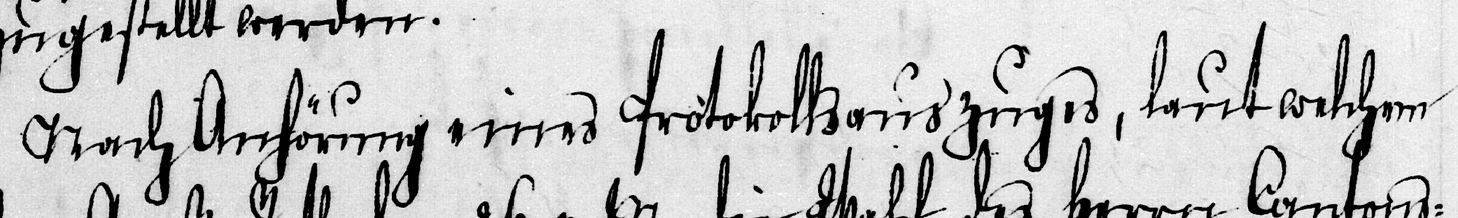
Nach Anhörung eines Protokollsauszuges, laut welchem
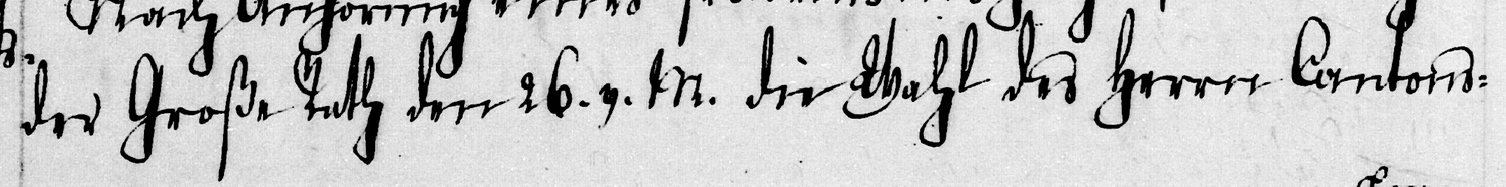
der Große Rath den 26. v. M. die Wahl des Herrn Cantons-
